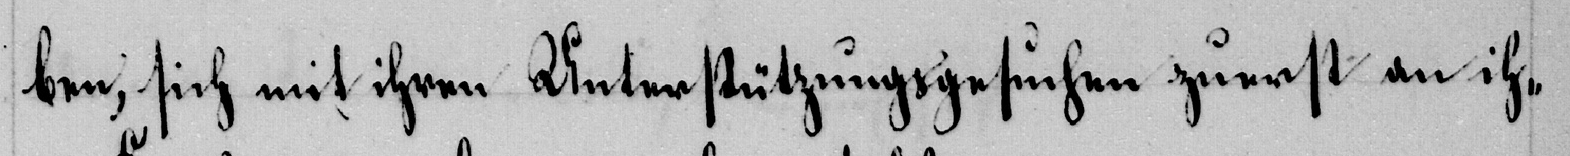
ben, sich mit ihren Unterstützungsgesuchen zuerst an ih¬
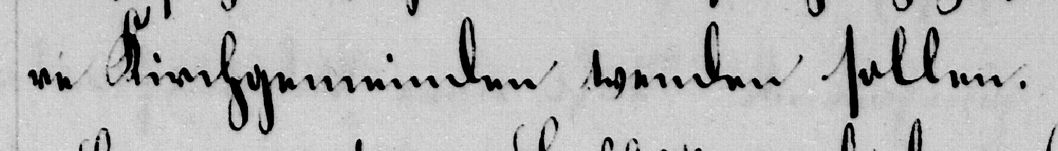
re Kirchgemeinden wenden sollen.
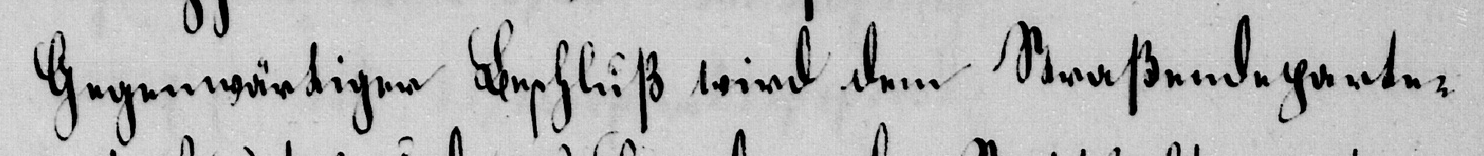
Gegenwärtiger Beschluß wird dem Straßendeparte¬
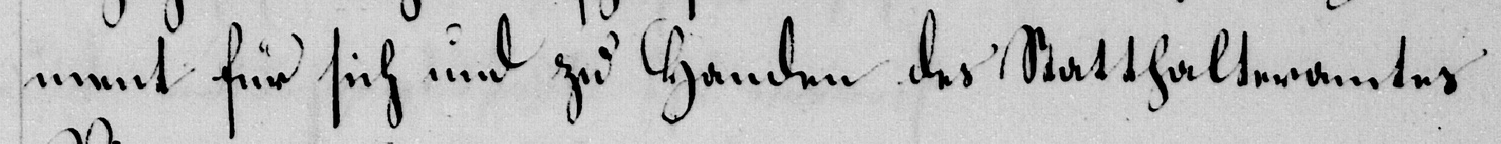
ment für sich und zu Handen des Statthalteramtes
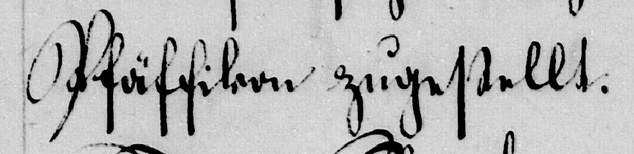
Pfäffikon zugestellt.
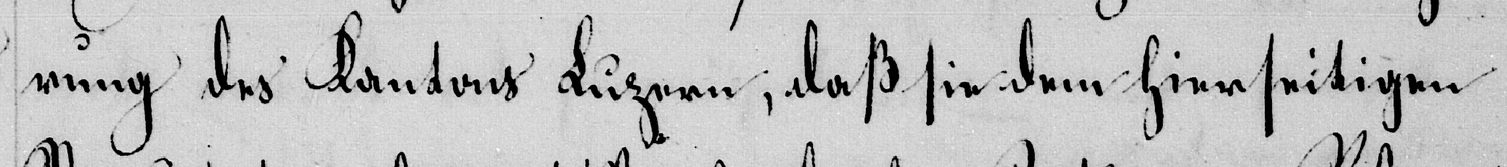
rung des Kantons Luzern, daß sie dem hierseitigen
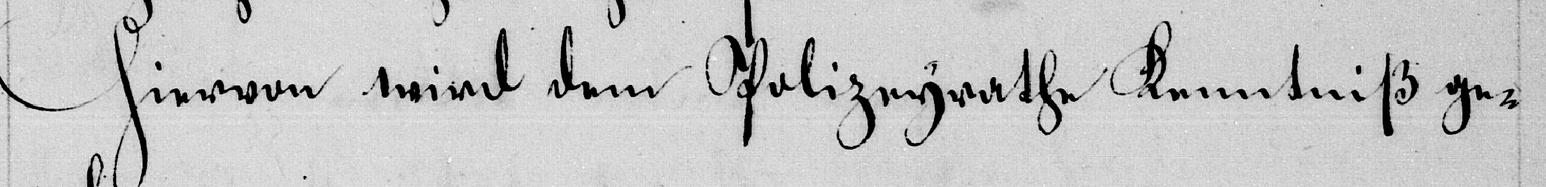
Hiervon wird dem Polizeyrathe Kenntniß ge¬
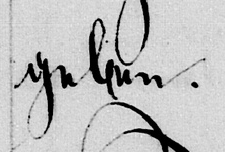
geben.
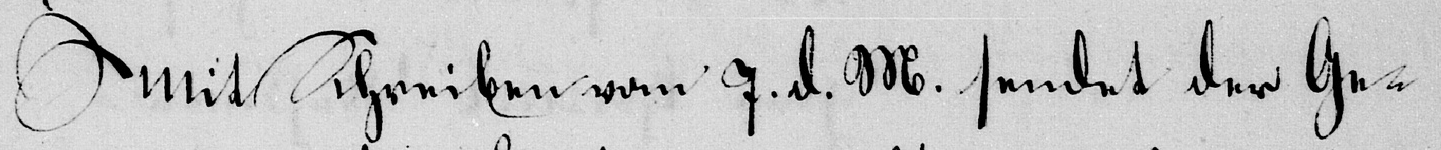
Mit Schreiben vom 7. d. M. sendet der Ge¬
